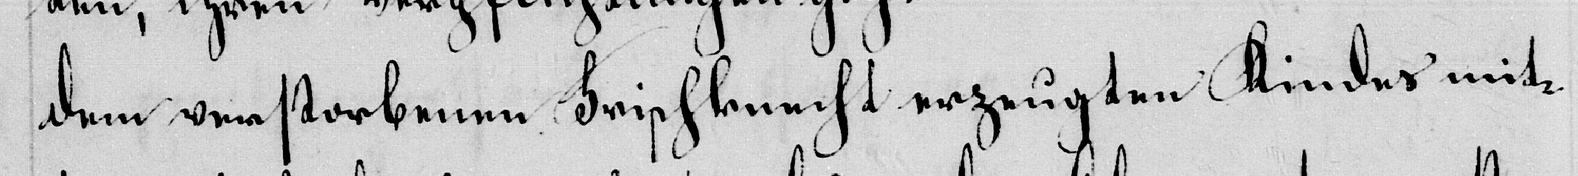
dem verstorbenen Frischknecht erzeugten Kindes mit¬
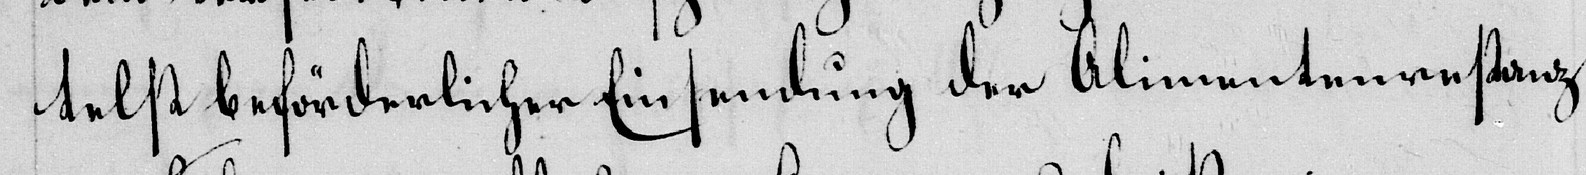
telst beförderlicher Einsendung der Alimentenrestanz
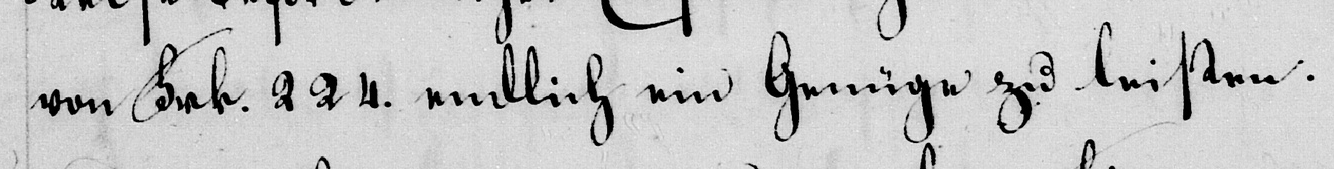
von Frk. 224. endlich ein Genüge zu leisten.
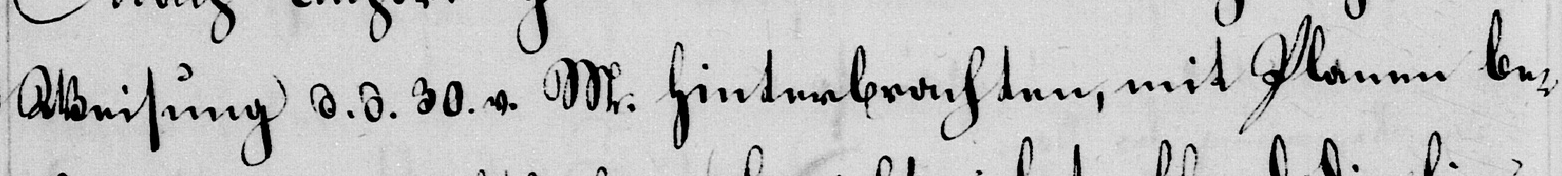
Weisung d. d. 30. v. M. hinterbrachten, mit Planen be¬
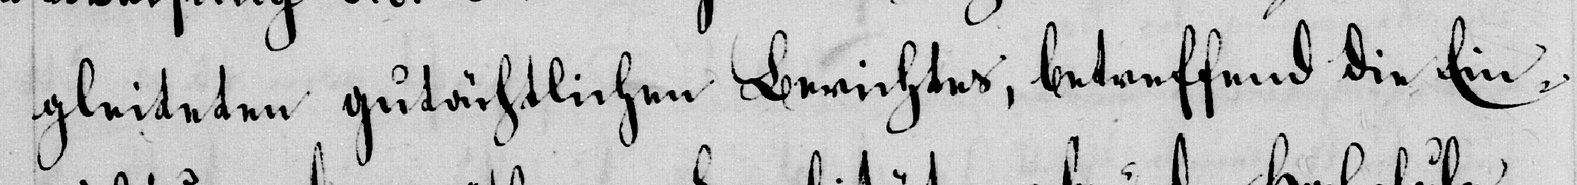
gleiteten gutächtlichen Berichtes, betreffend die Ein¬
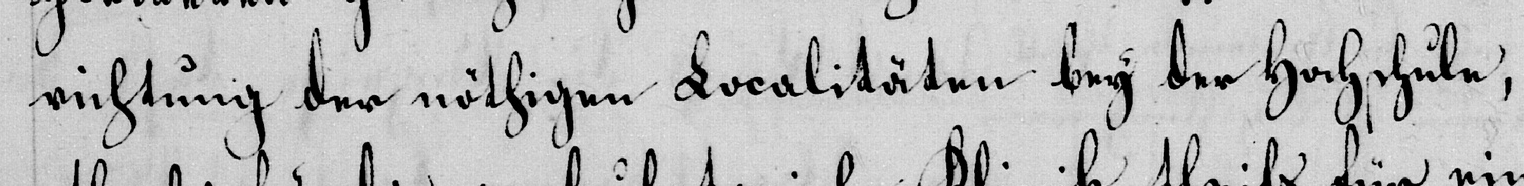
richtung der nöthigen Localitäten bey der Hochschule,
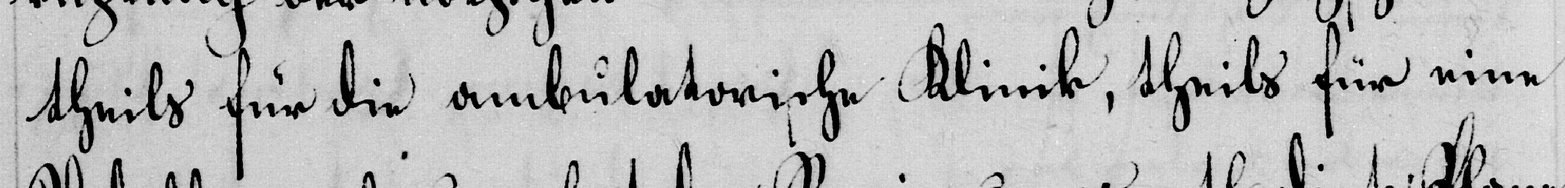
theils für die ambulatorische Klinik, theils für eine
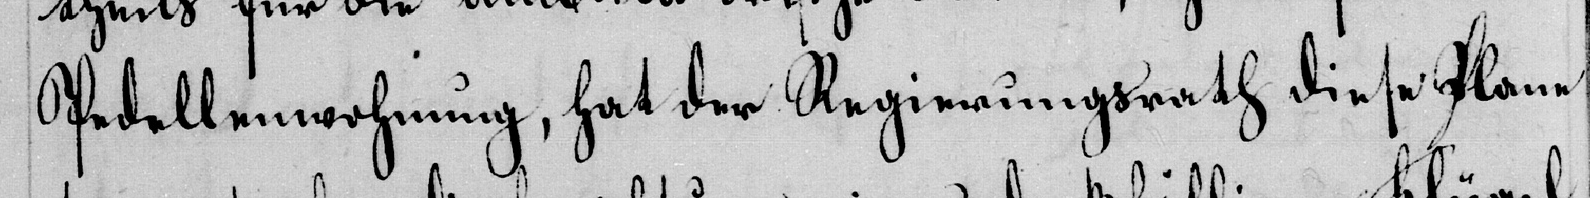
Pedellenwohnung, hat der Regierungsrath diese Plane
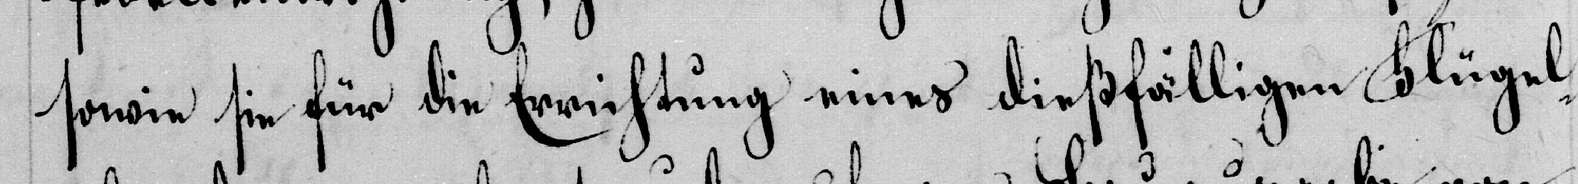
sowie sie für die Errichtung eines dießfälligen Flügel¬
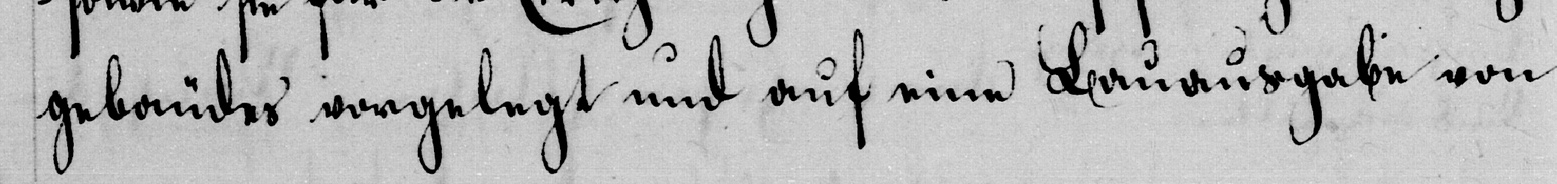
gebäudes vorgelegt und auf eine Bauausgabe von
